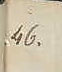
46.
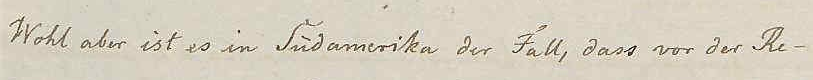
Wohl aber ist es in Südamerika der Fall, dass vor der Re-
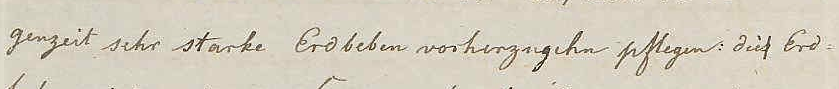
genzeit sehr starke Erdbeben vorherzugehn pflegen: dies Erd-
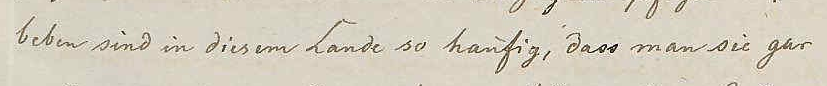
beben sind in diesem Lande so häufig, dass man sie gar
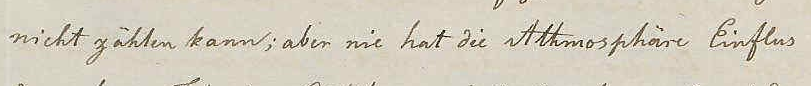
nicht zählen kann; aber nie hat die Athmosphäre Einflus
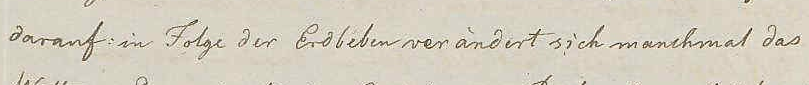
darauf: in Folge der Erdbeben verändert sich manchmal das
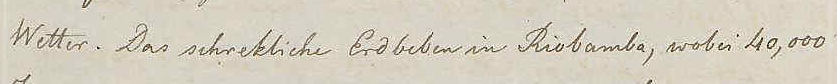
Wetter. Das schrekliche Erdbeben in Riobamba, wobei 40,000
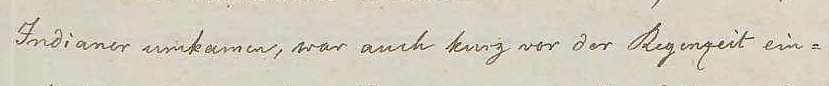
Indianer umkamen, war auch kurz vor der Regenzeit ein-
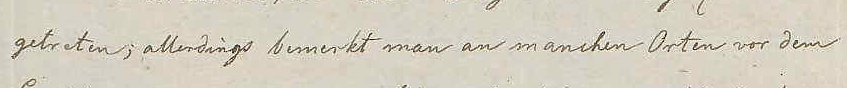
getreten; allerdings bemerkt man an manchen Orten vor dem
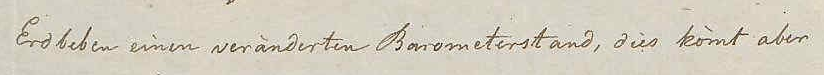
Erdbeben einen veränderten Barometerstand, dies kömt aber
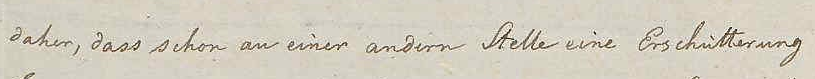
daher, dass schon an einer andern Stelle eine Erschütterung
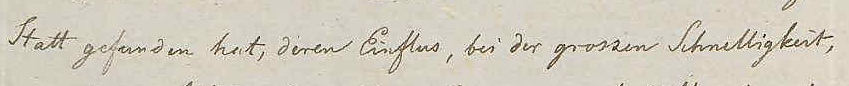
Statt gefunden hat, deren Einflus, bei der grossen Schnelligkeit,
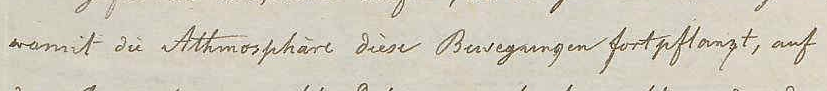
womit die Athmosphäre diese Bewegungen fortpflanzt, auf
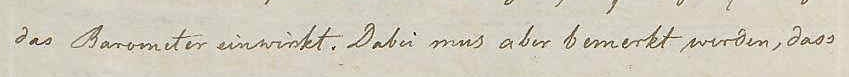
das Barometer einwirkt. Dabei mus aber bemerkt werden, dass
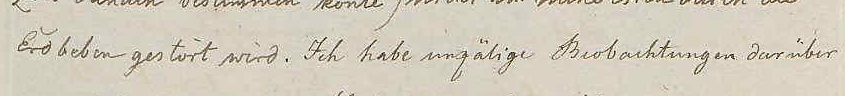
Erdbeben gestört wird. Ich habe unzälige Beobachtungen darüber
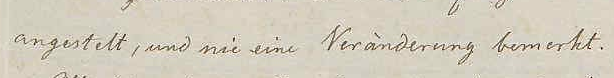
angestelt, und nie eine Veränderung bemerkt.
